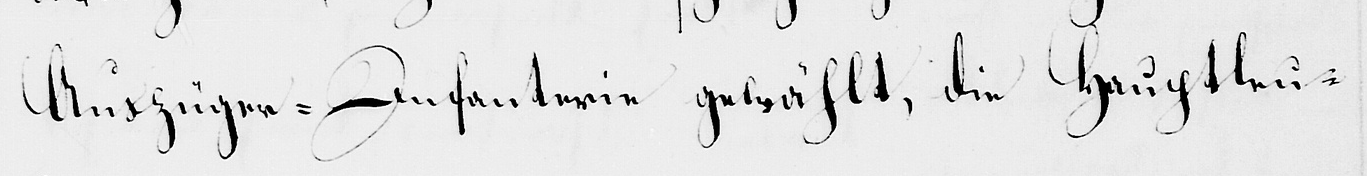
Auszüger-Infanterie gewählt, die Hauptleu¬
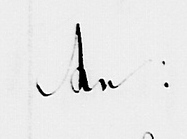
te:
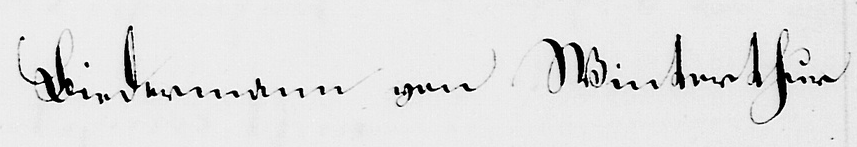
Biedermann von Winterthur
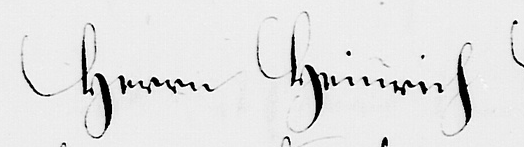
Herrn Heinrich
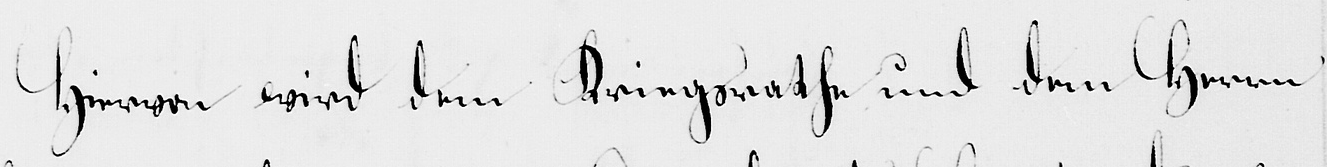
Hiervon wird dem Kriegsrathe und dem Herrn
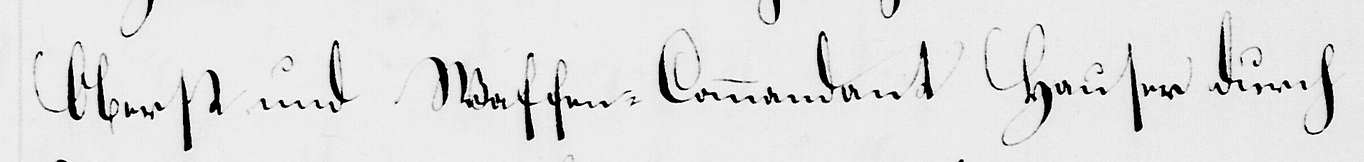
Oberst und Waffen-Commandant Hauser durch
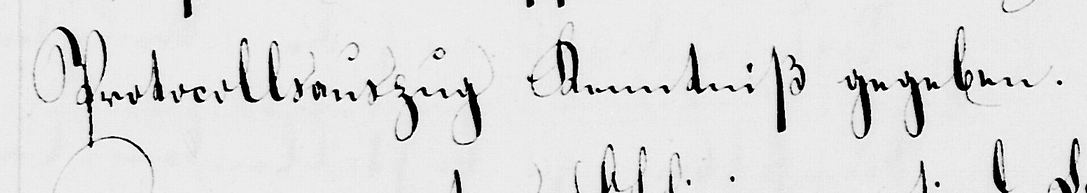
Protocollsauszug Kenntniß gegeben.
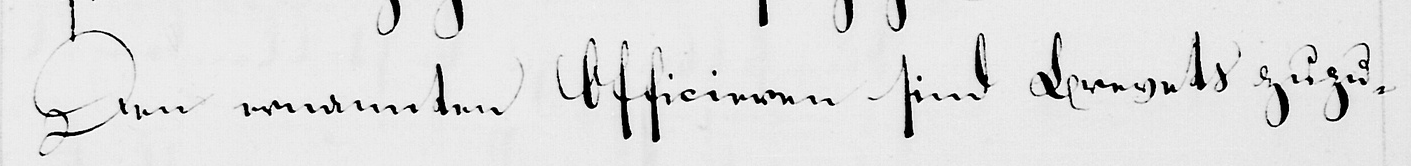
Den ernannten Officieren sind Brevets zuzu¬
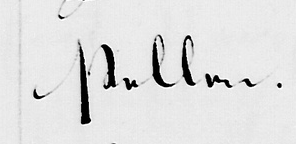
stellen.
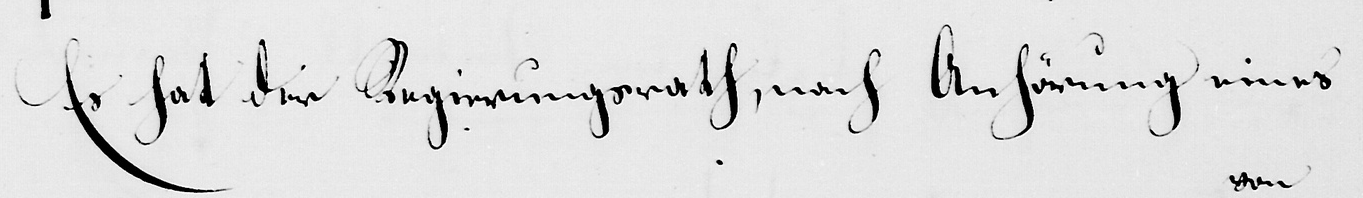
Es hat der Regierungsrath, nach Anhörung eines
